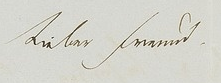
Lieber Freund.
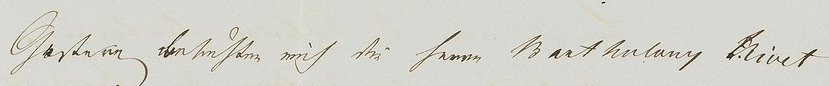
Gestern besuchten mich die Herrn BartholonyRivet
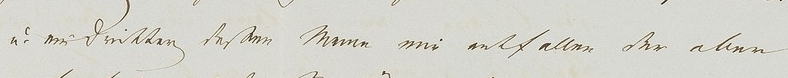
u. ein Dritter deßen Name mir entfallen der aber
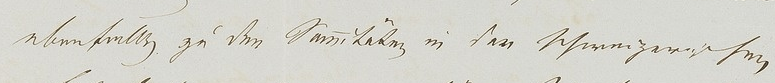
ebenfalls zu den Sommitäten in den schweizerischen
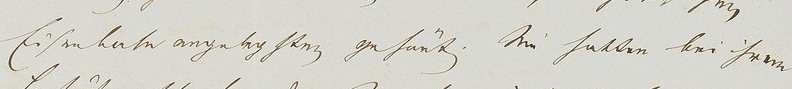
Eisenbahnangelegenheiten gehört. Sie hatten bei ihrem
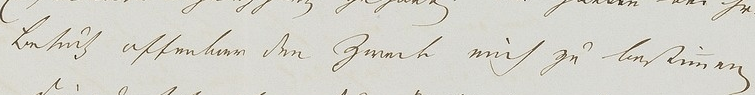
Besuch offenbar den Zweck mich zu bestimmen
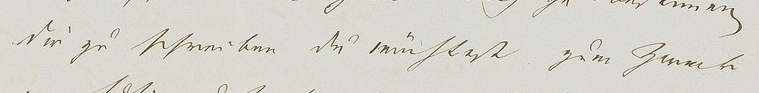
dir zu schreiben du möchtest zum Zweck
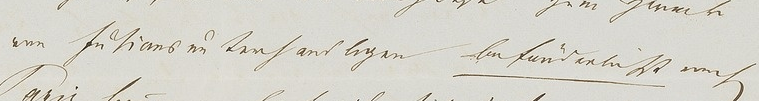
von Fusionsunterhandlungen beförderlichst nach
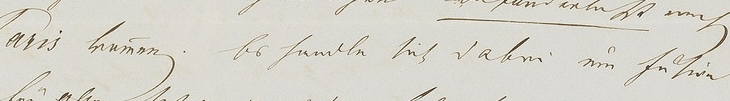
Paris kommen. Es handle sich dabei um Fusion
